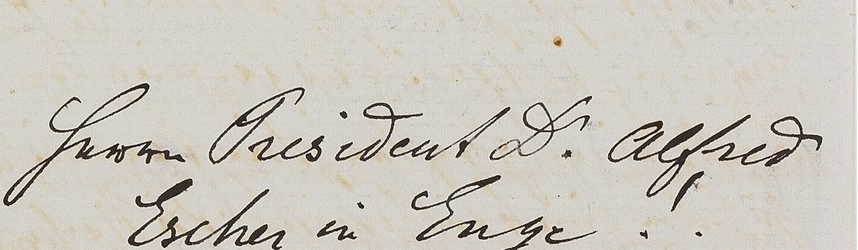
Herrn President Dr Alfred
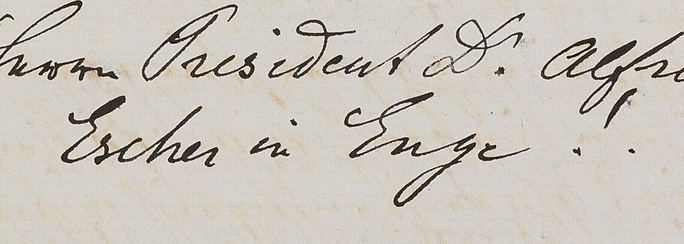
Escher in Enge!
